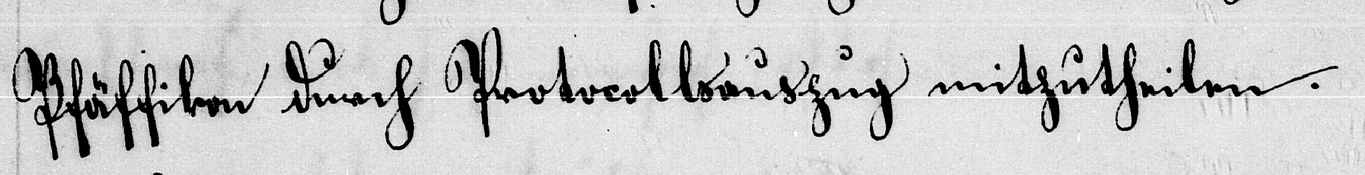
Pfäffikon durch Protocollsauszug mitzutheilen.
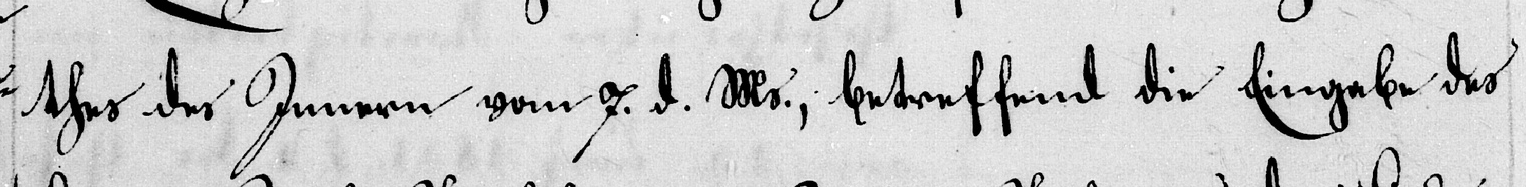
thes des Innern vom 7. d. Ms., betreffend die Eingabe des
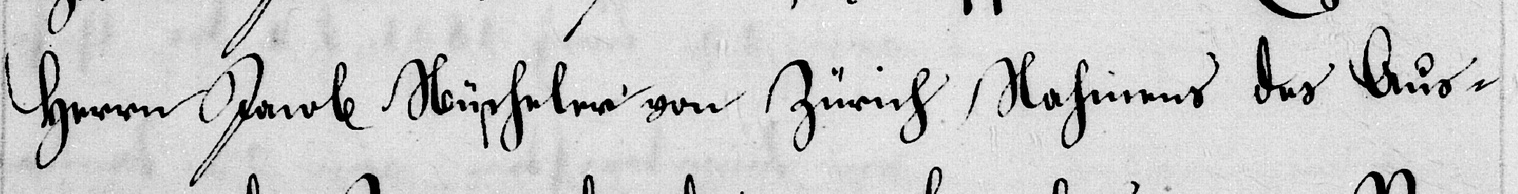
Herrn Jacob Nüscheler von Zürich Nahmens des Aus¬
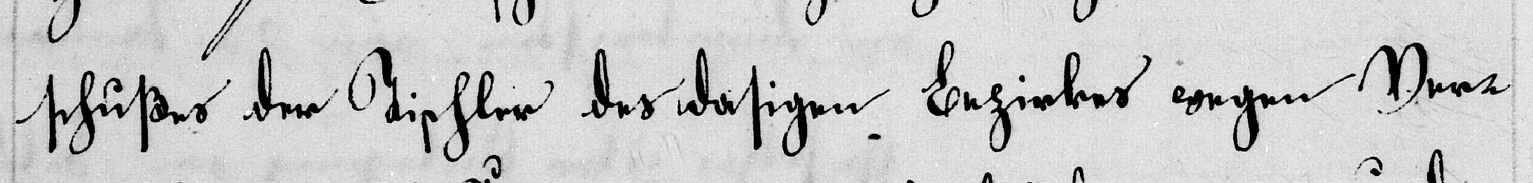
schußes der Tischler des dasigen Bezirkes wegen Ver¬
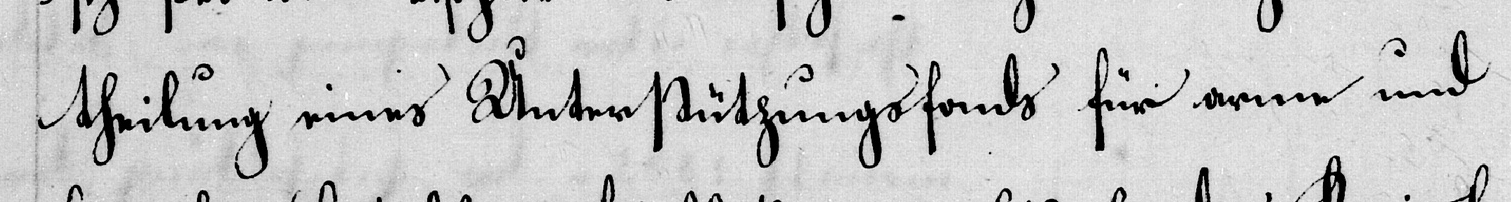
theilung eines Unterstützungsfonds für arme und
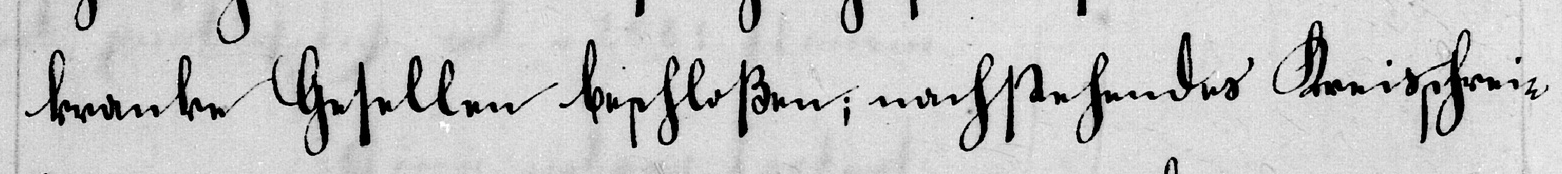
kranke Gesellen beschloßen; nachstehendes Kreisschei¬
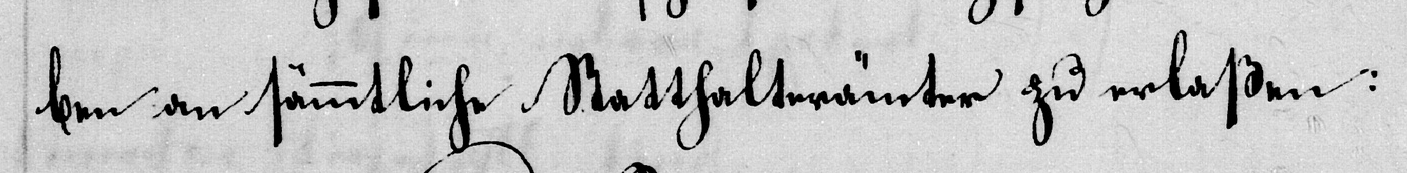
ben an sämmtliche Statthalterämter zu erlaßen:
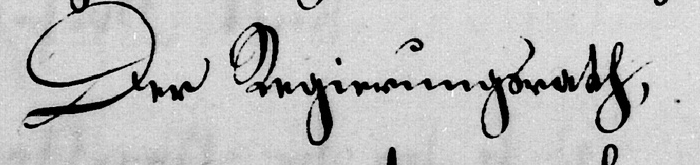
Der Regierungsrath,
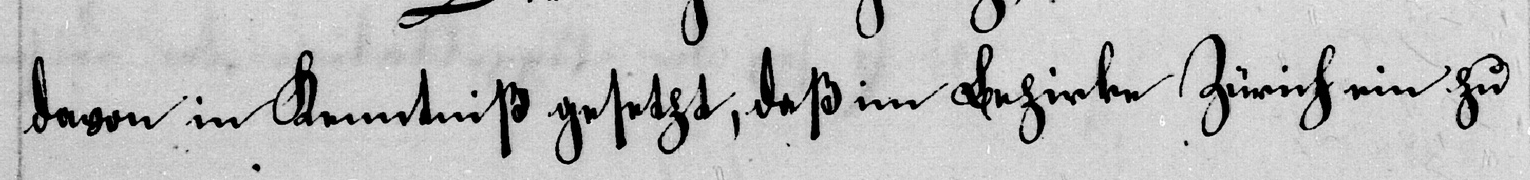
davon in Kenntniß gesetzt, daß im Bezirke Zürich ein zu
